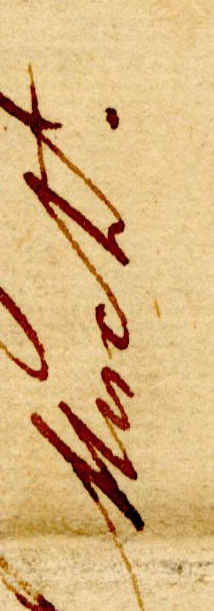Merch^t
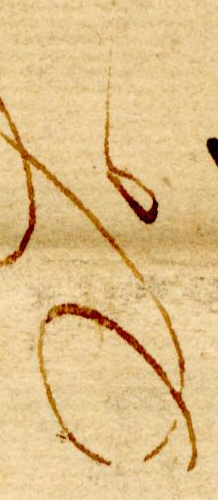To
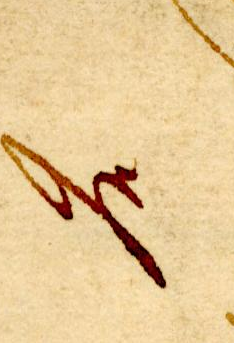In
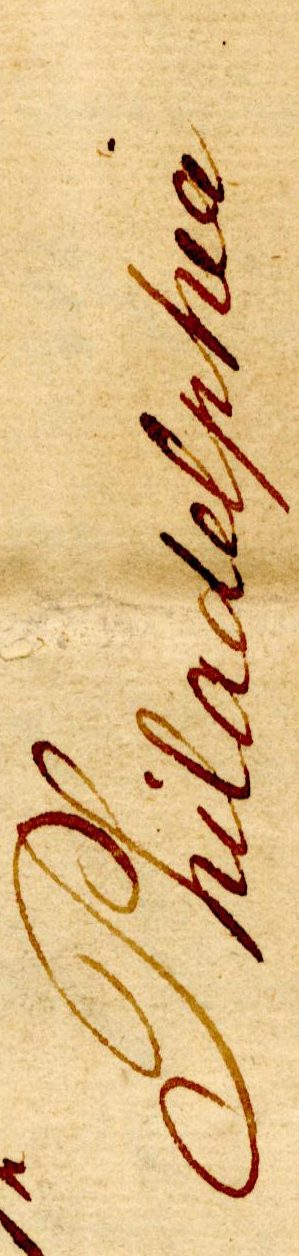Philadelphia
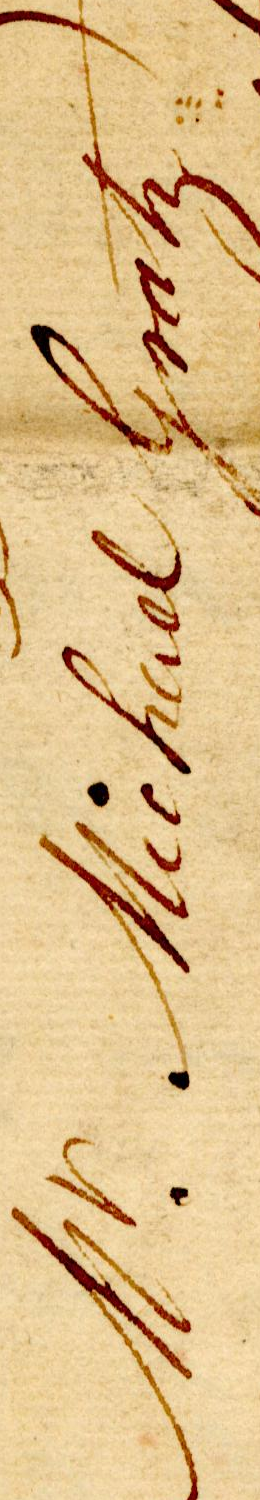M^r Michael Gratz
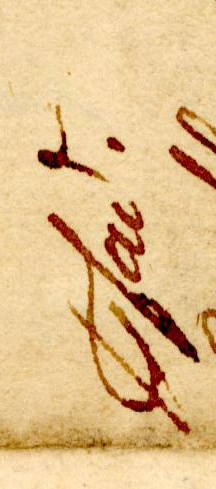Fav^r
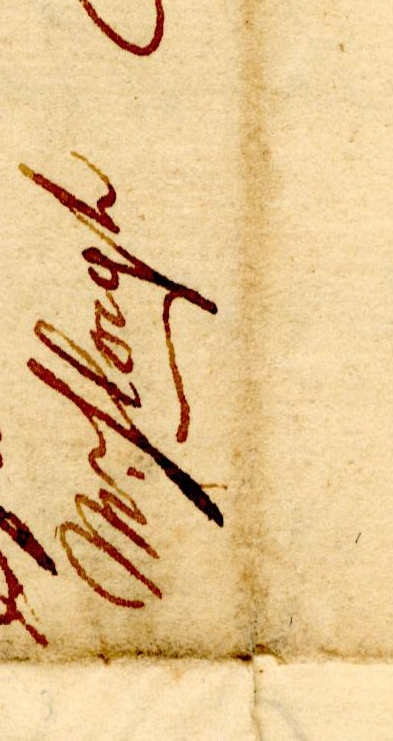M^r Hough
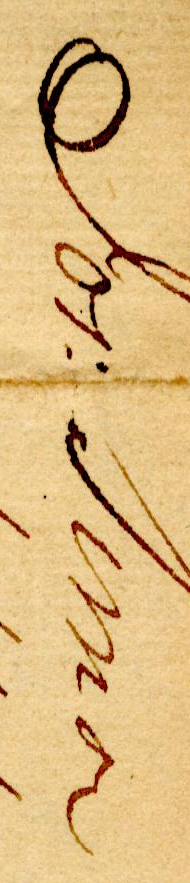Jos: Simon
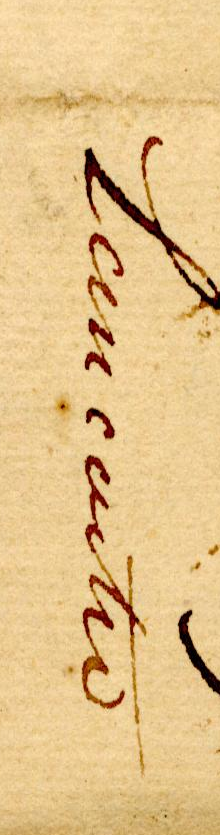Lancaster
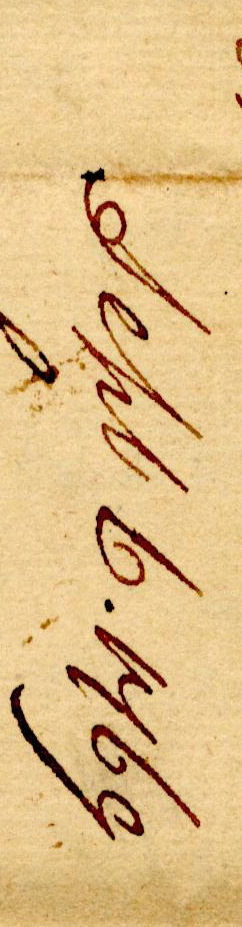Sept^r 6. 1769
